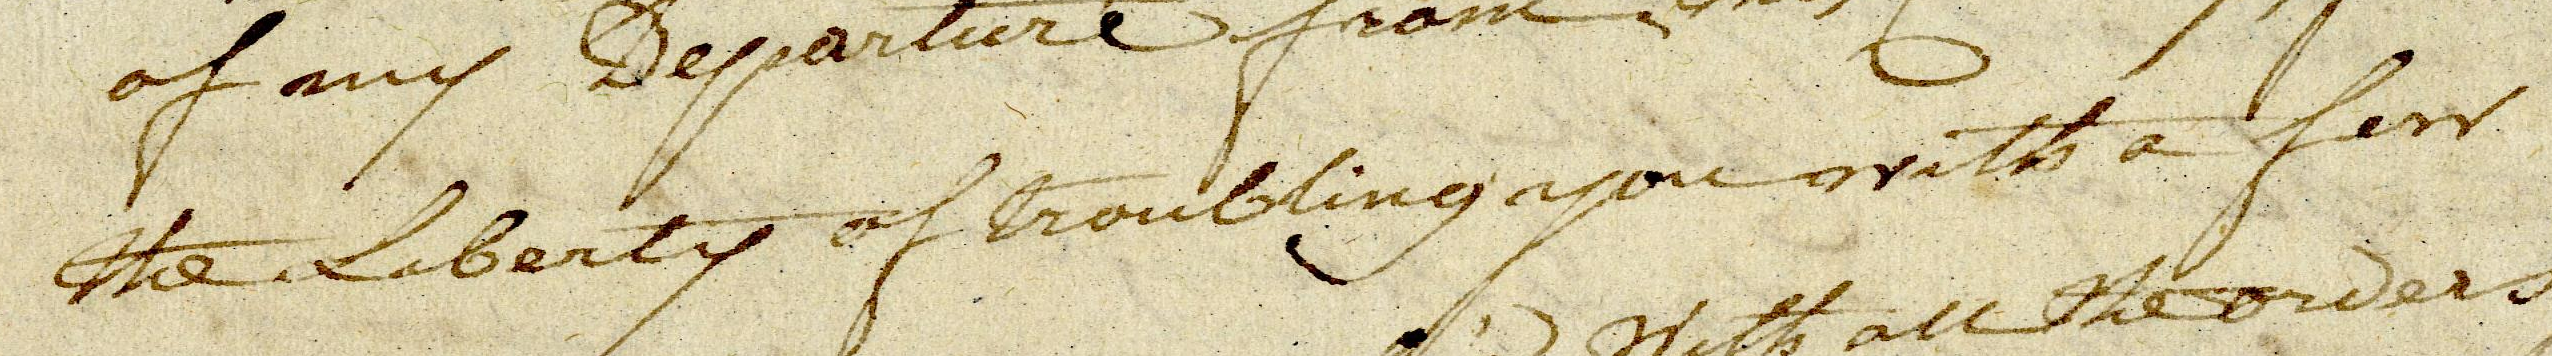the Liberty of troubling you with a few
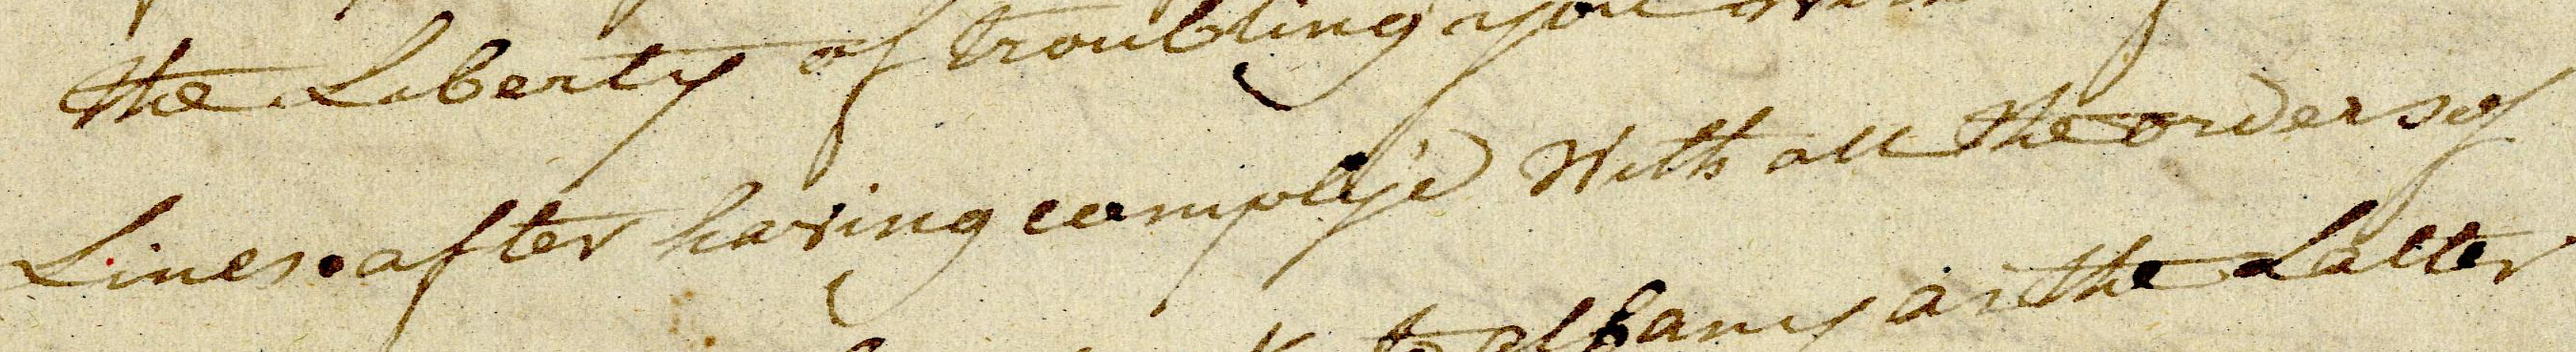Lines after having comply'd with all the orders of
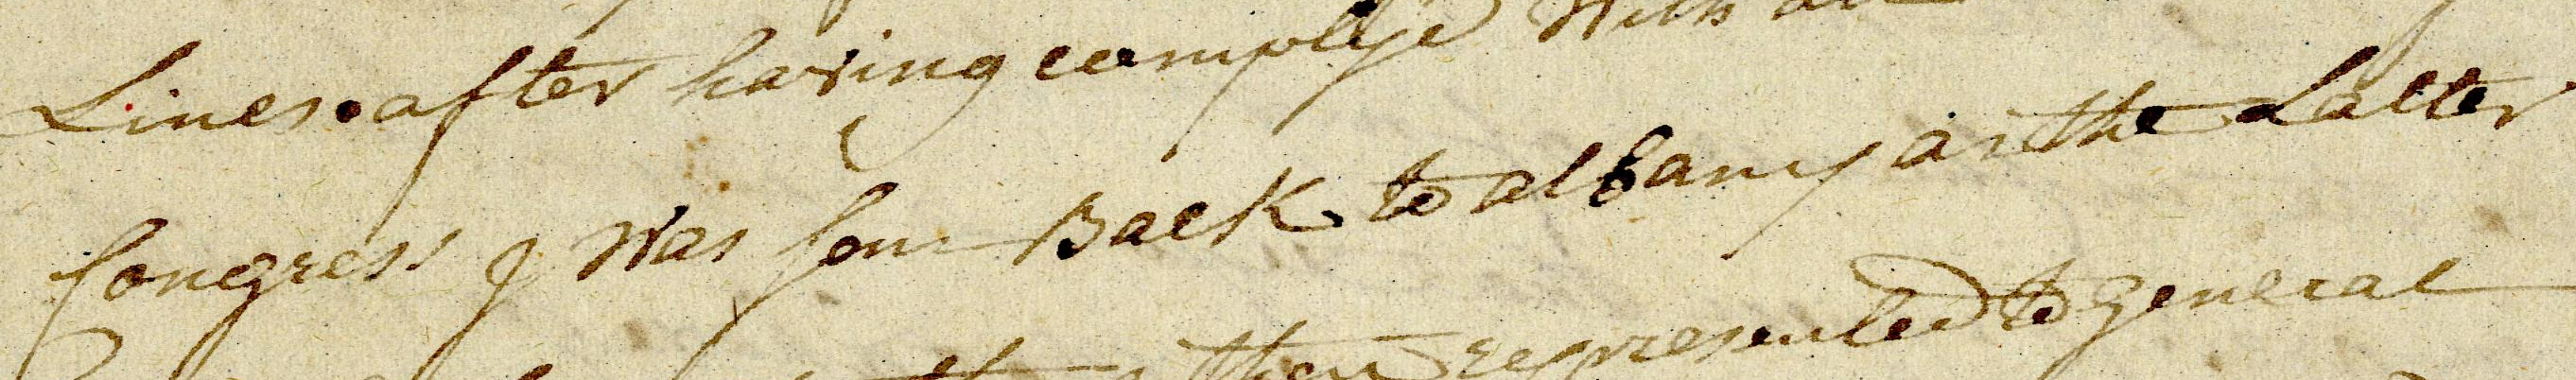Congress & was gone back to albany at the Latter
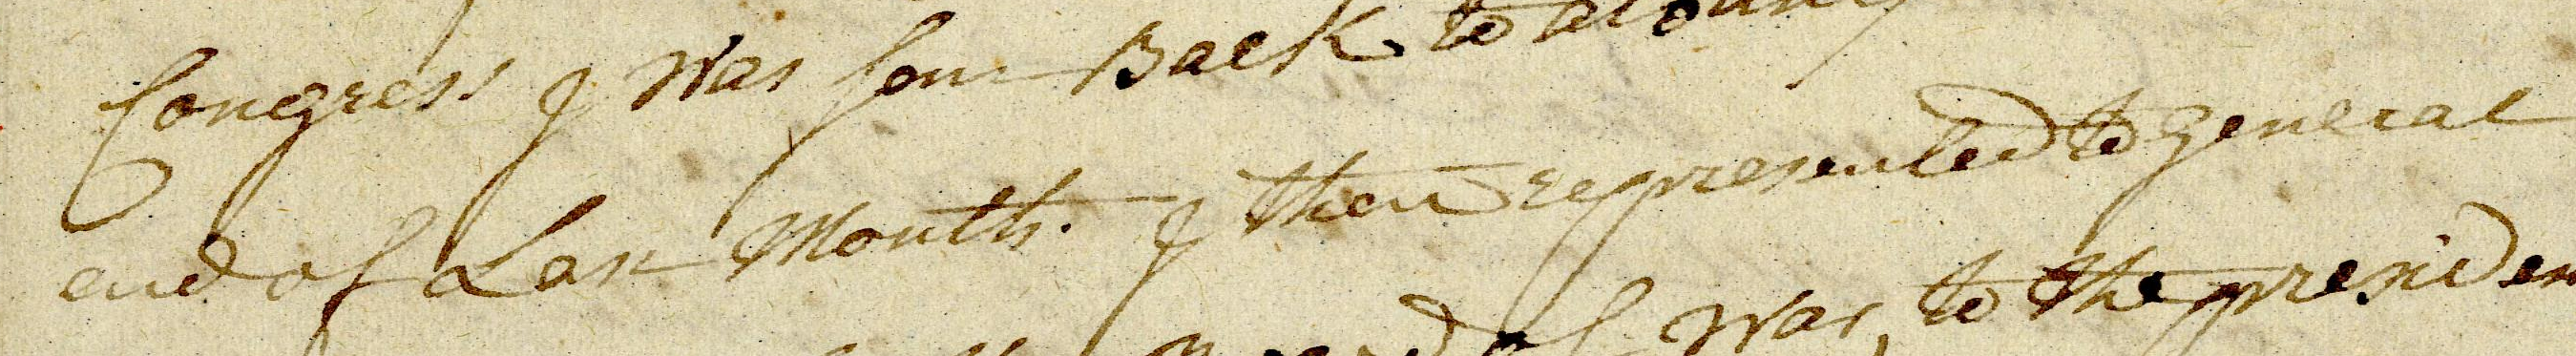end of Last Month. I then represented to general
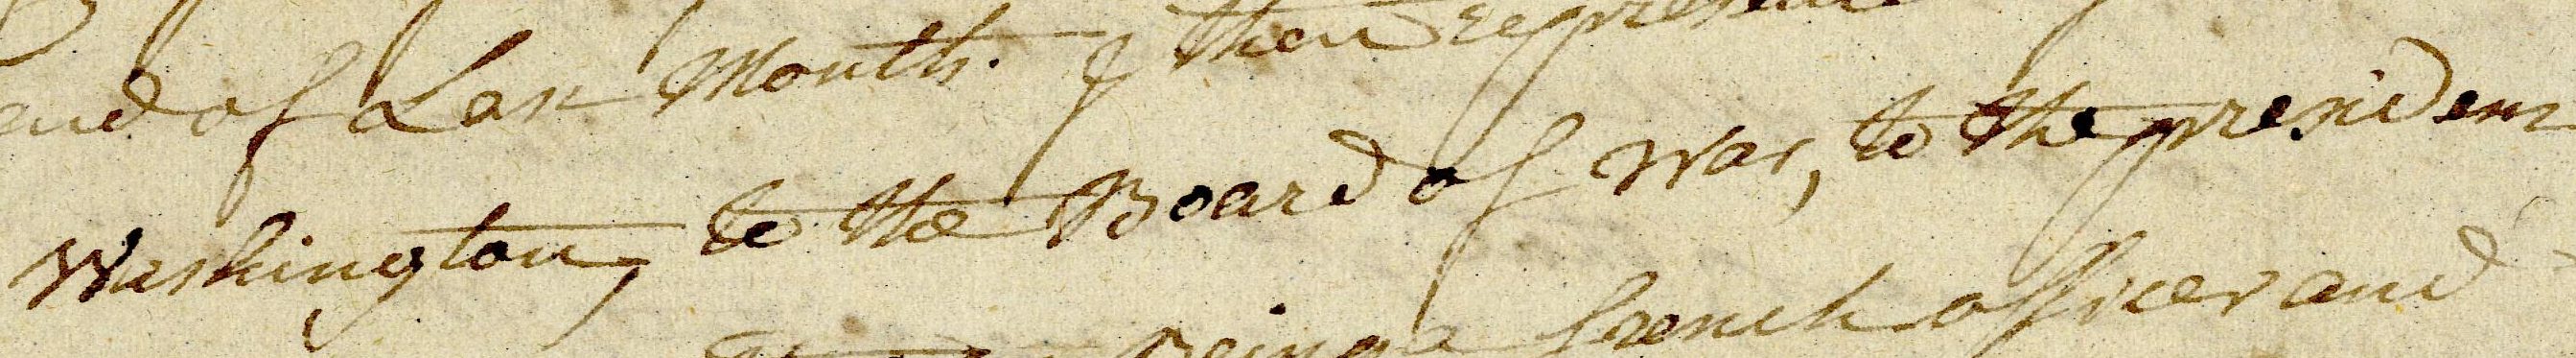Washington, to the Board of War, to the president
